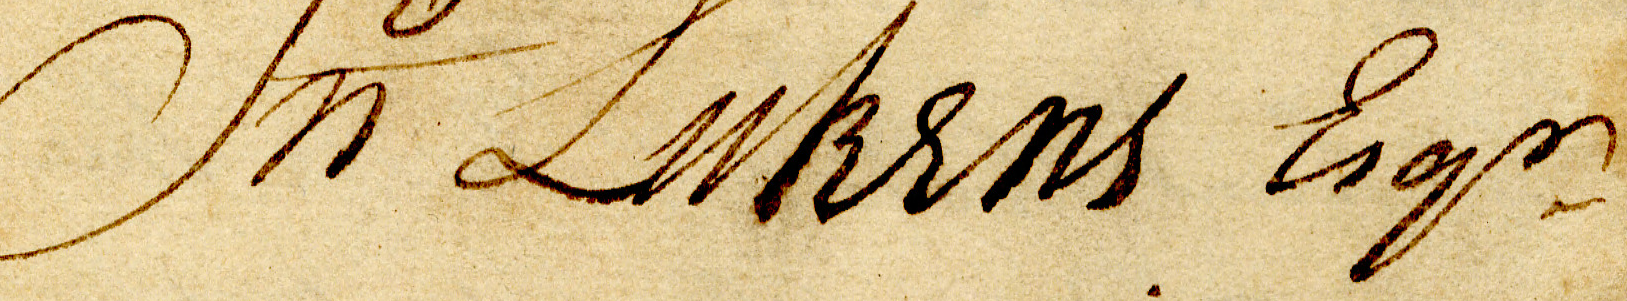Jn^o Lukens Esq^r
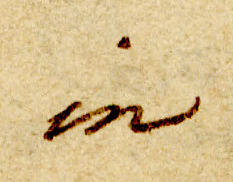in
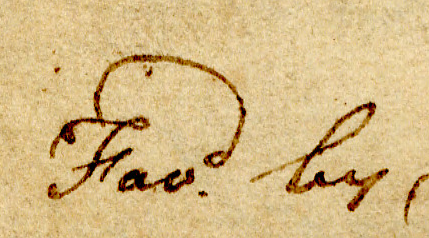Fav^d. by
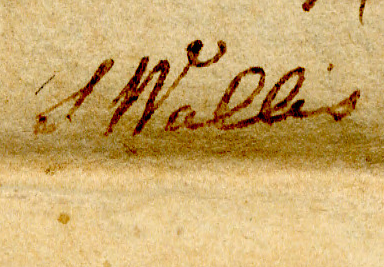J Wallis
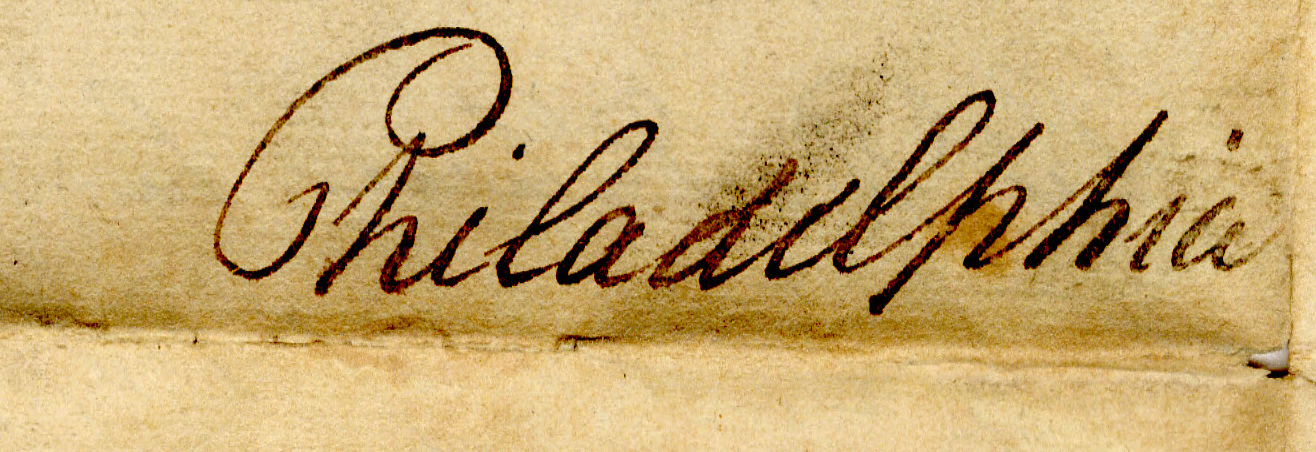Philadelphia
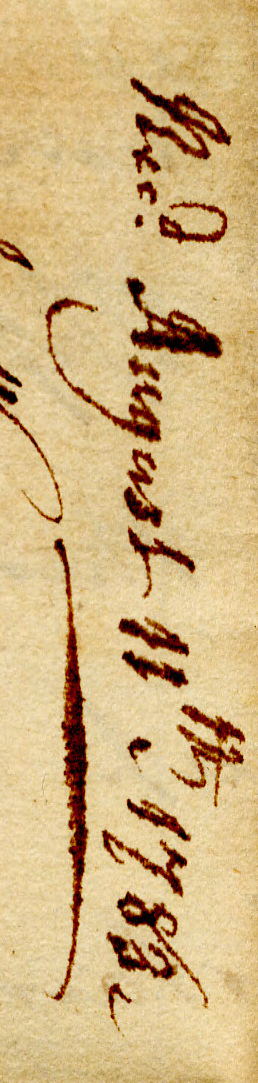Rec^d. August 11^th. 1783
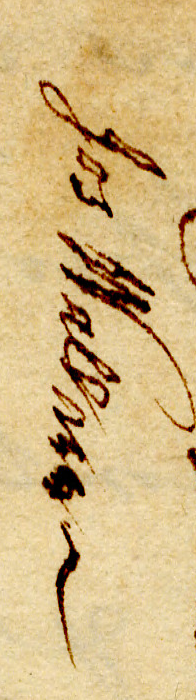Jos Wallace
